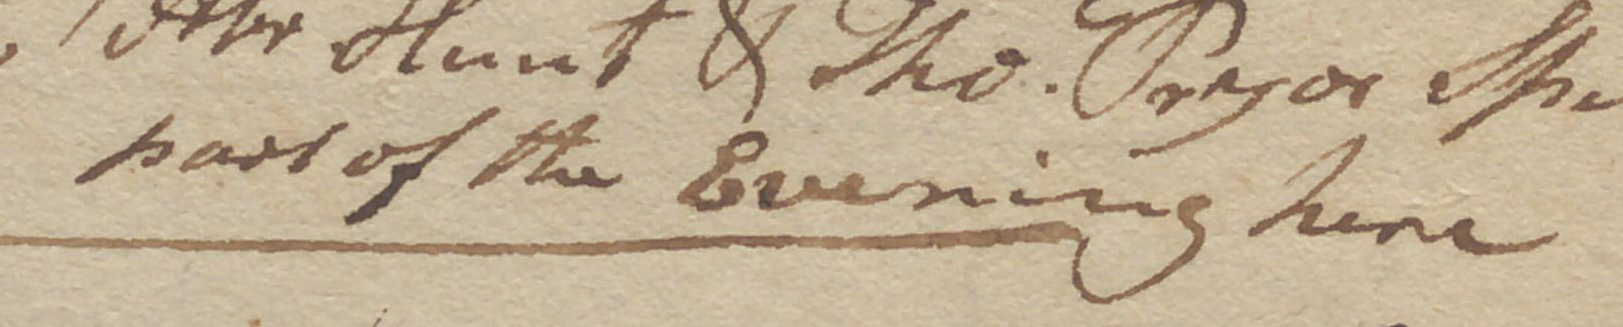part of the Evening here
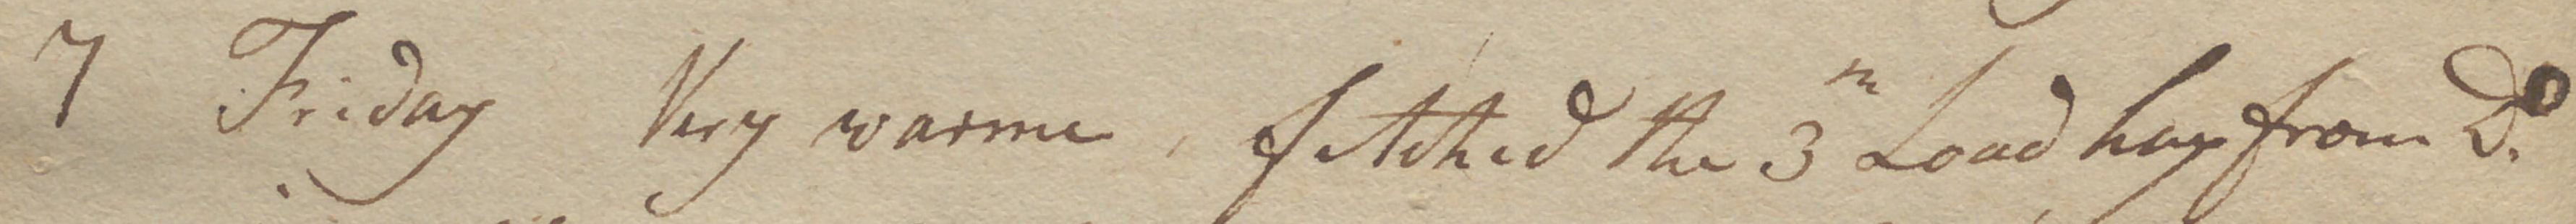7 Friday Very warme fetched the 3^th Load hay from D^o.
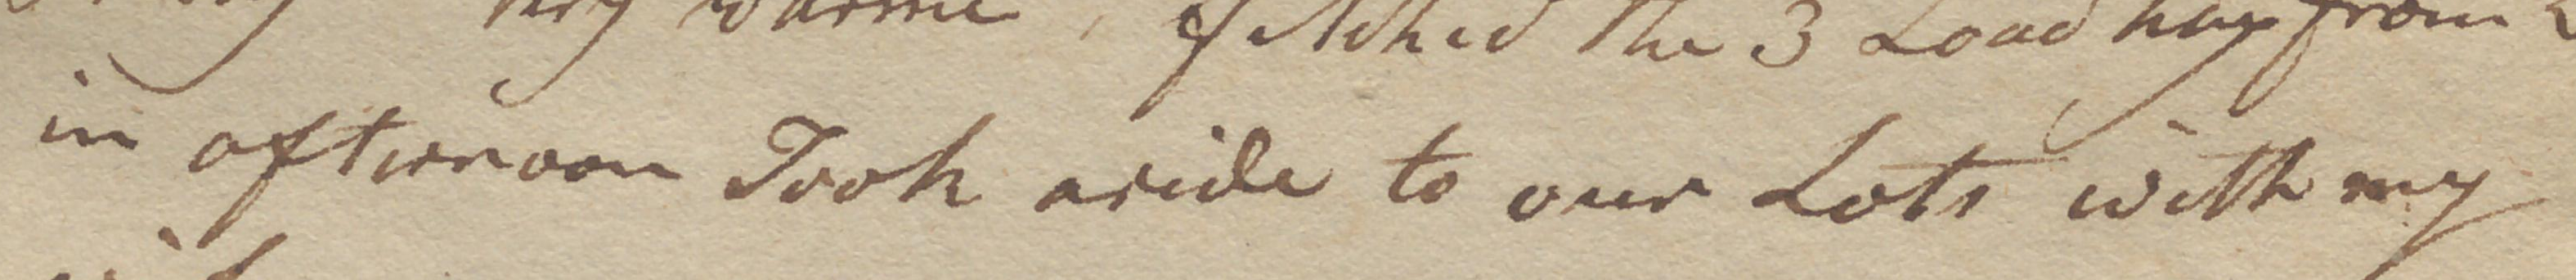in afternoon Took a ride to our Lots with my
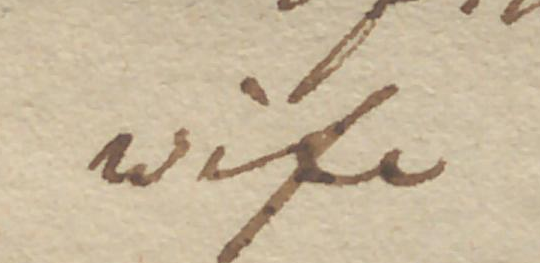wife
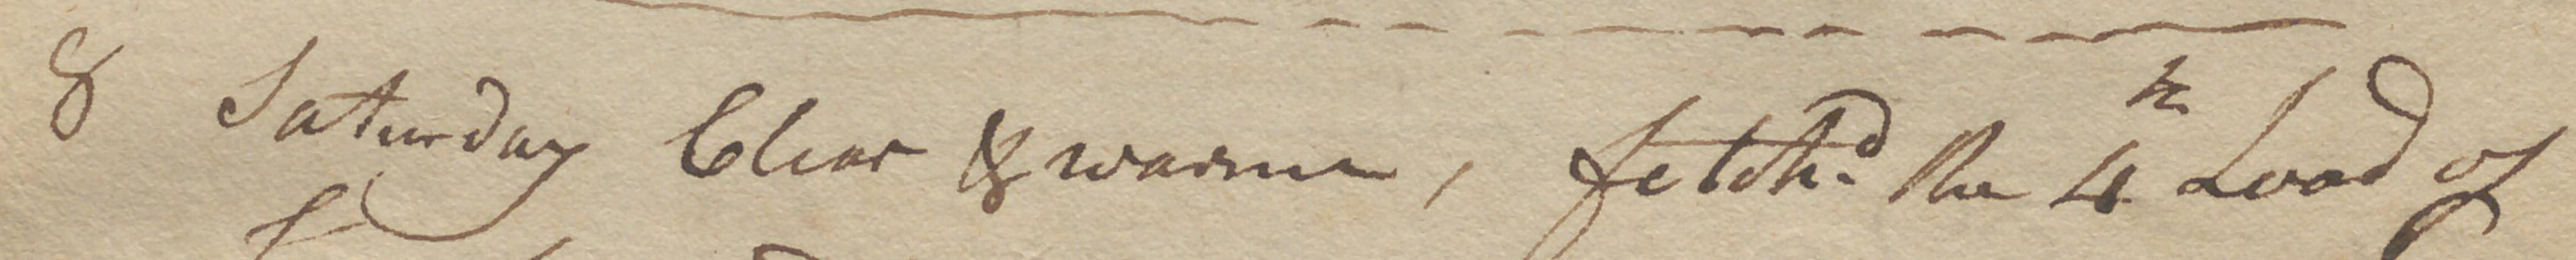8 Saturday Clear & warme, fetch^d. the 4^th Load of
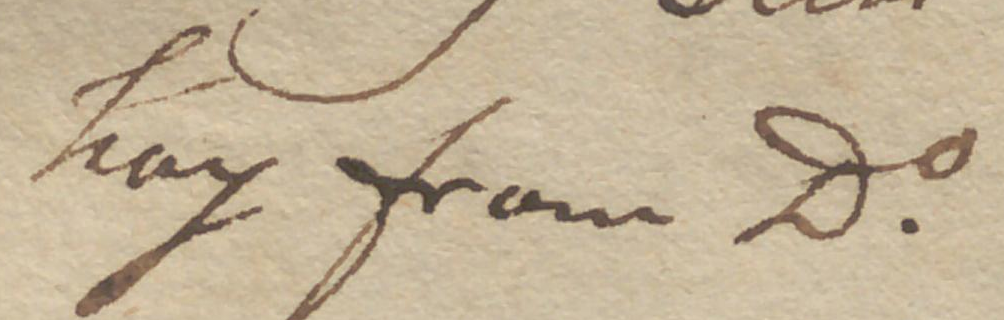hay from D^o.
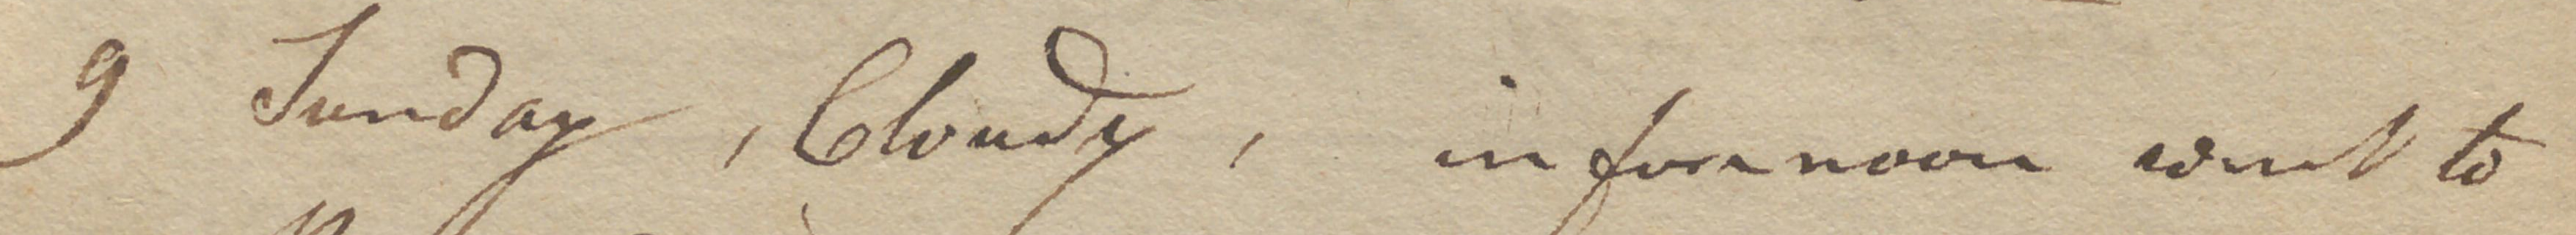9 Sunday, Cloudy, in forenoon went to
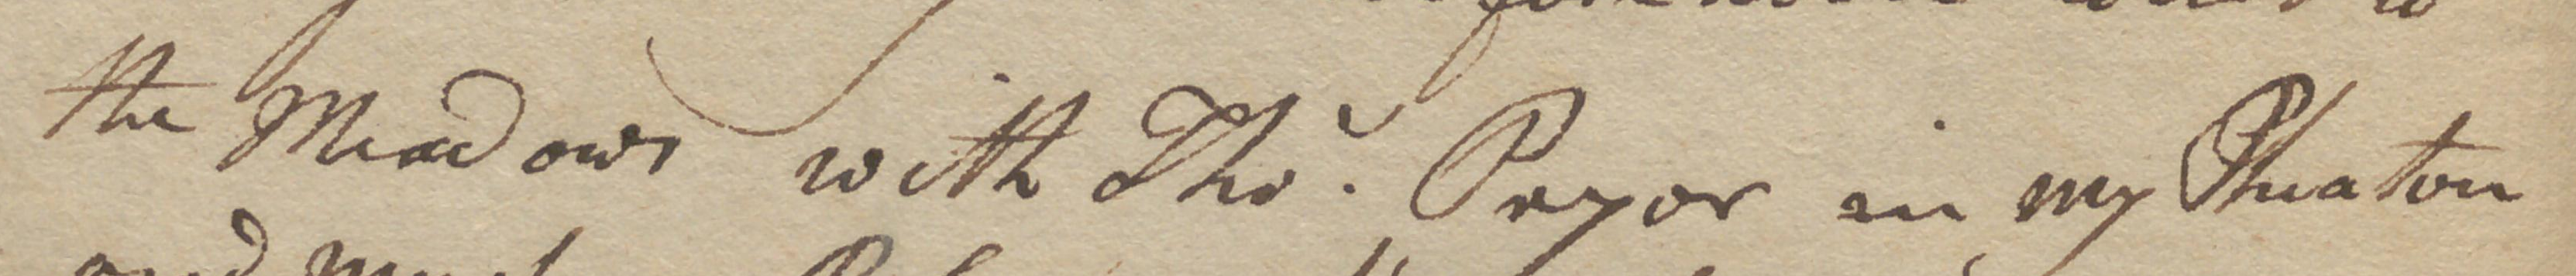the Meadows with Tho^s. Pryor in my Pheaton
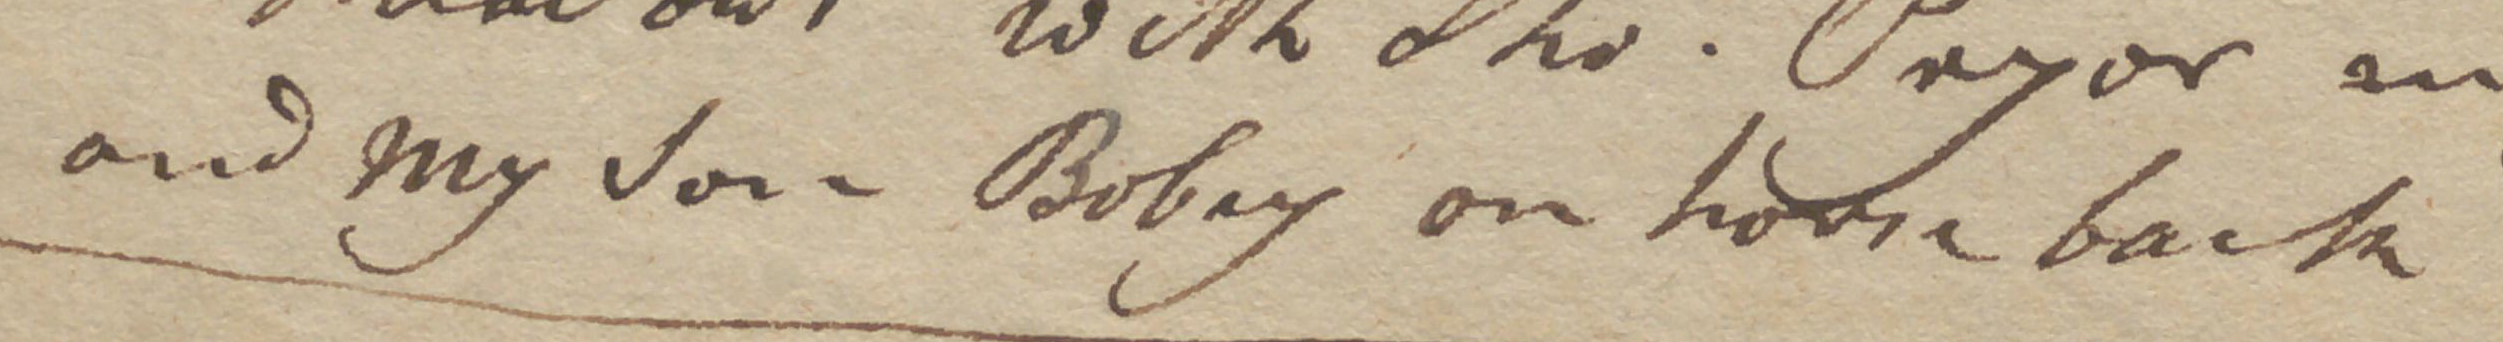and my son Bobey on hosse back
